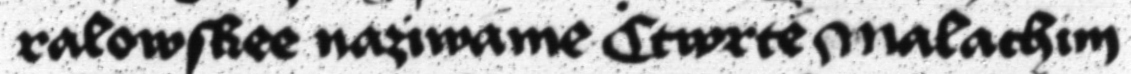ralowſkee nażiwánie Ċtwrté Malachim
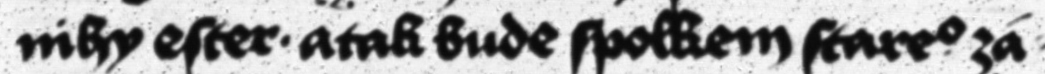nihy eſter. a tak bude ſpolkem ſtare° zá
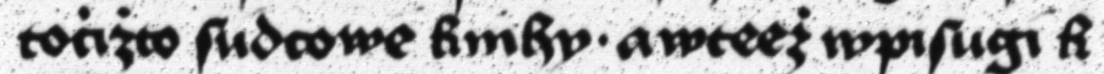toċiżto ſúdcowé knihy. a wteeż wpiſugí k
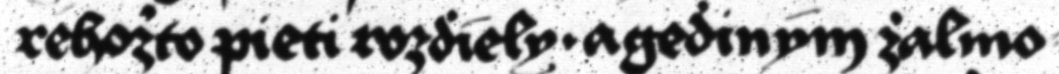réhożto pieti rozḋíely. a geḋiným żalmo
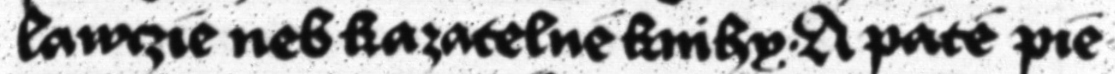lawczíe neb kazatelné knihy. A páté píe
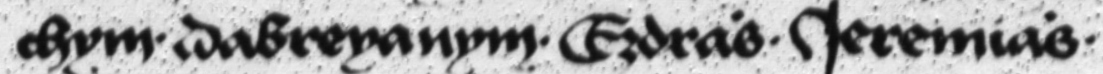chym. Dabreyanym. Ezdraṡ. Ieremiaṡ
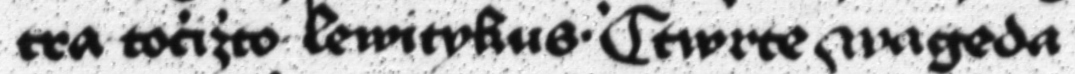tra toċiżto lewitykus. Ċtwrte wageda
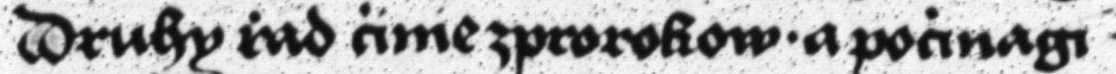Druhy ṙad ċinie zprorokow. a poċinagi
